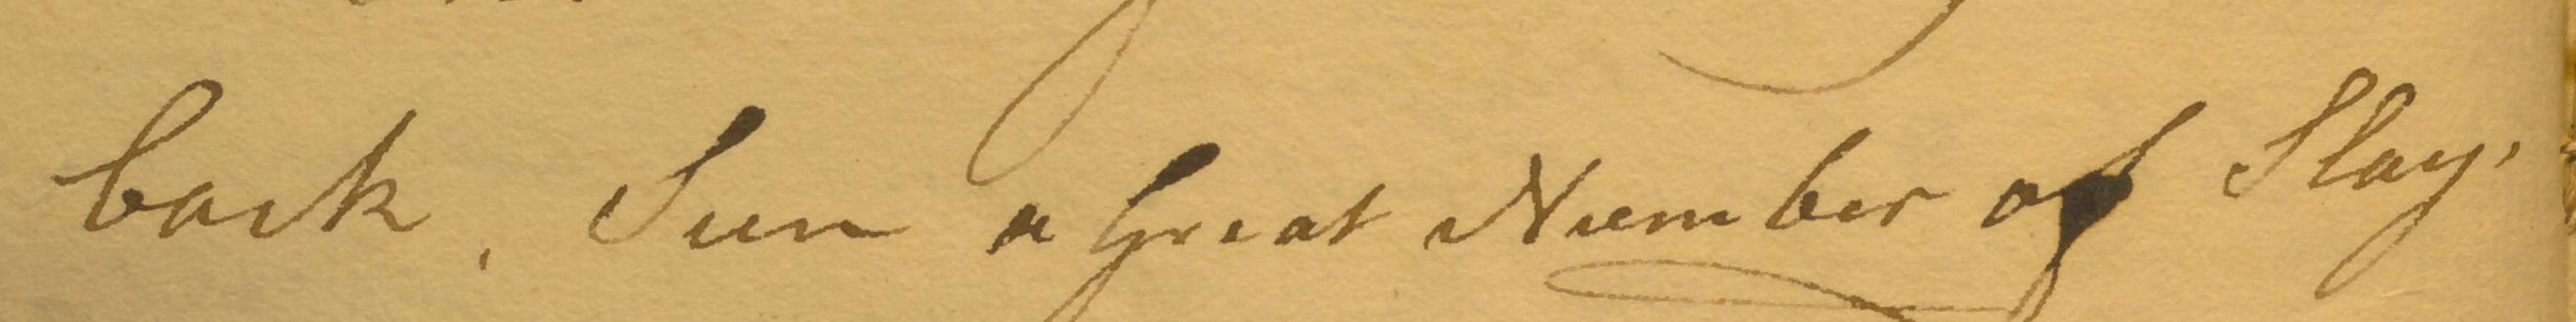back seen a Great Number of Slays
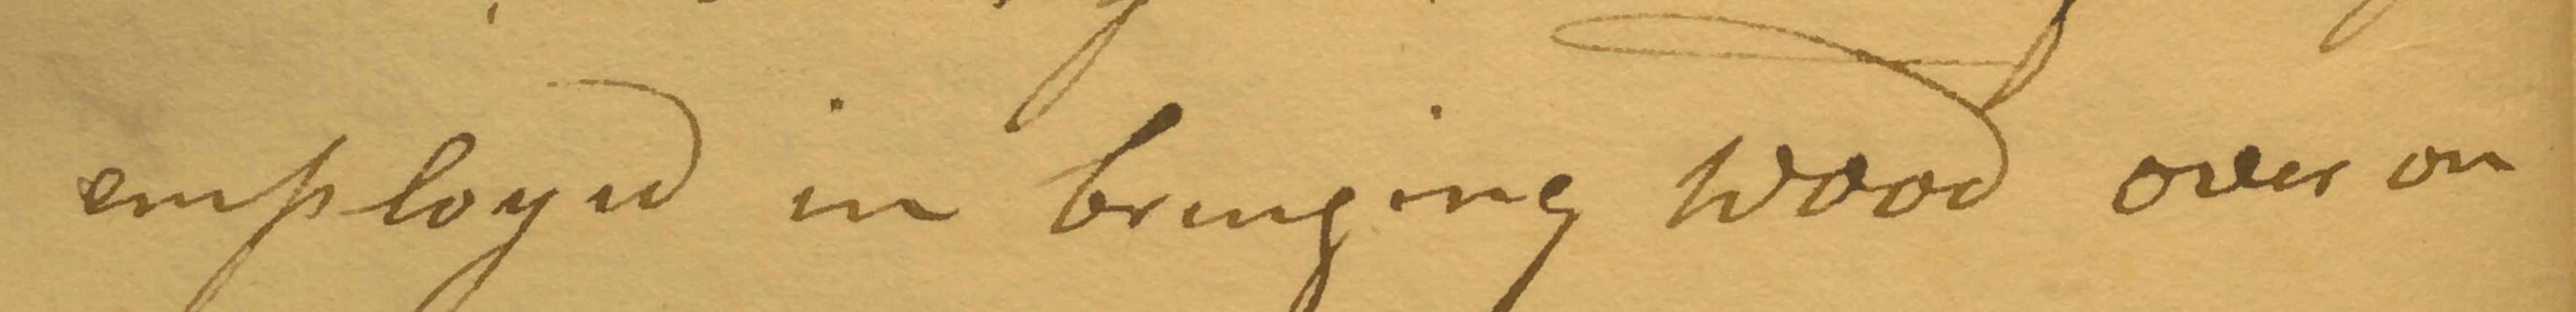employed in bringing Wood over on
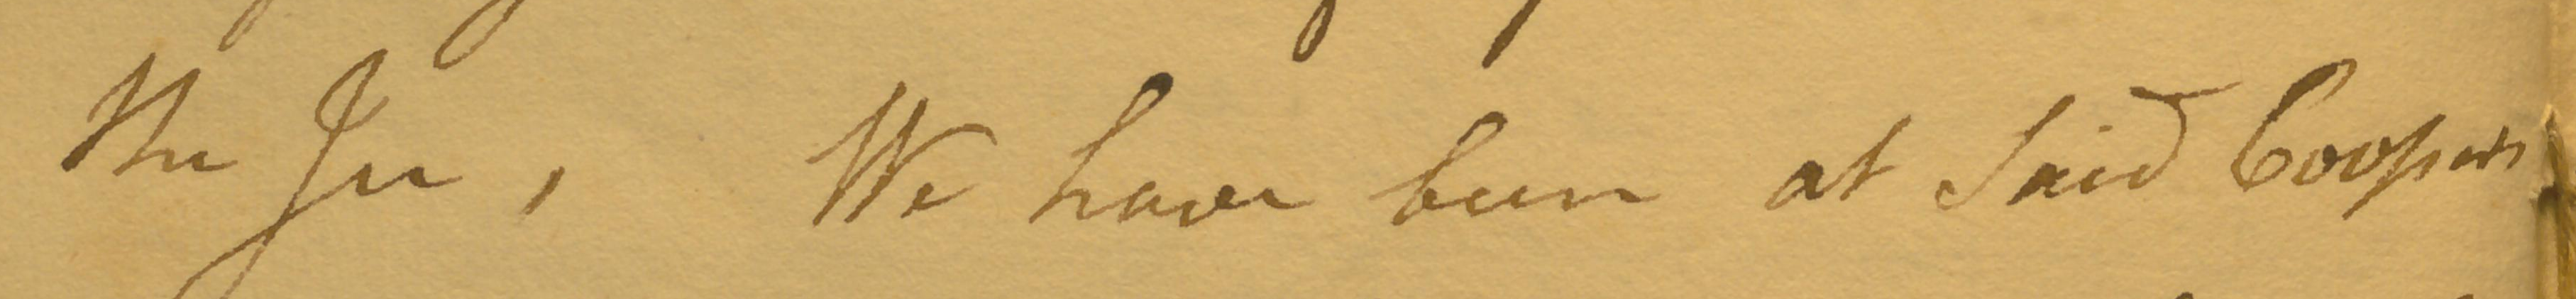the Ice, We have been at Said Cooper
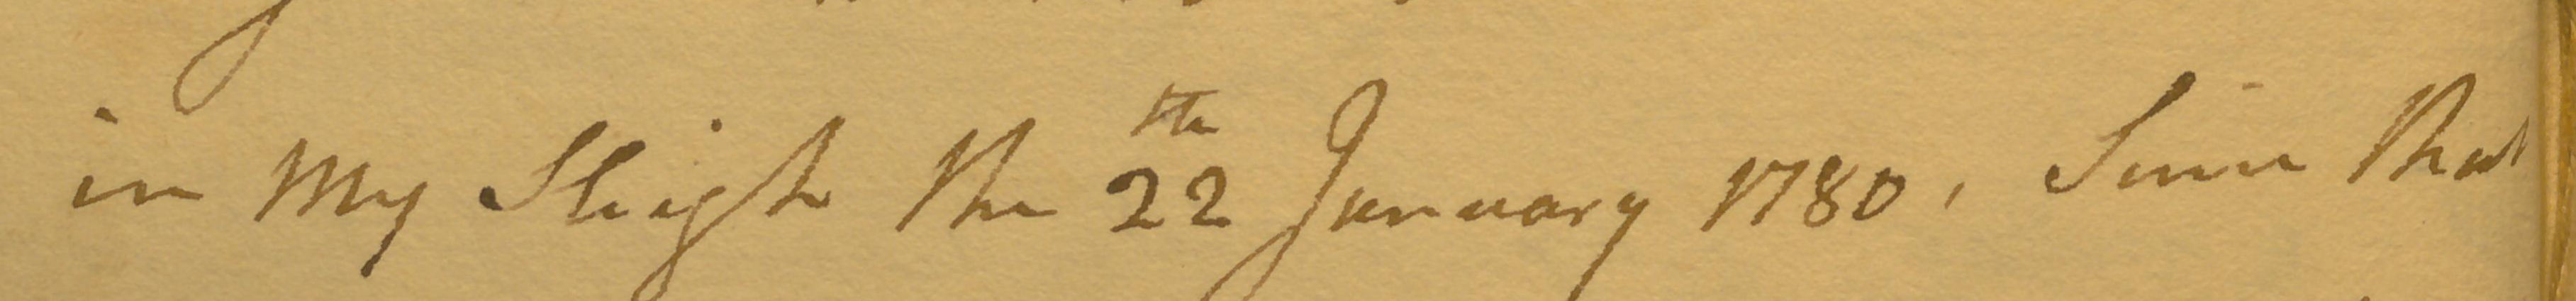in My Sleigh the 22^th January 1780, since that
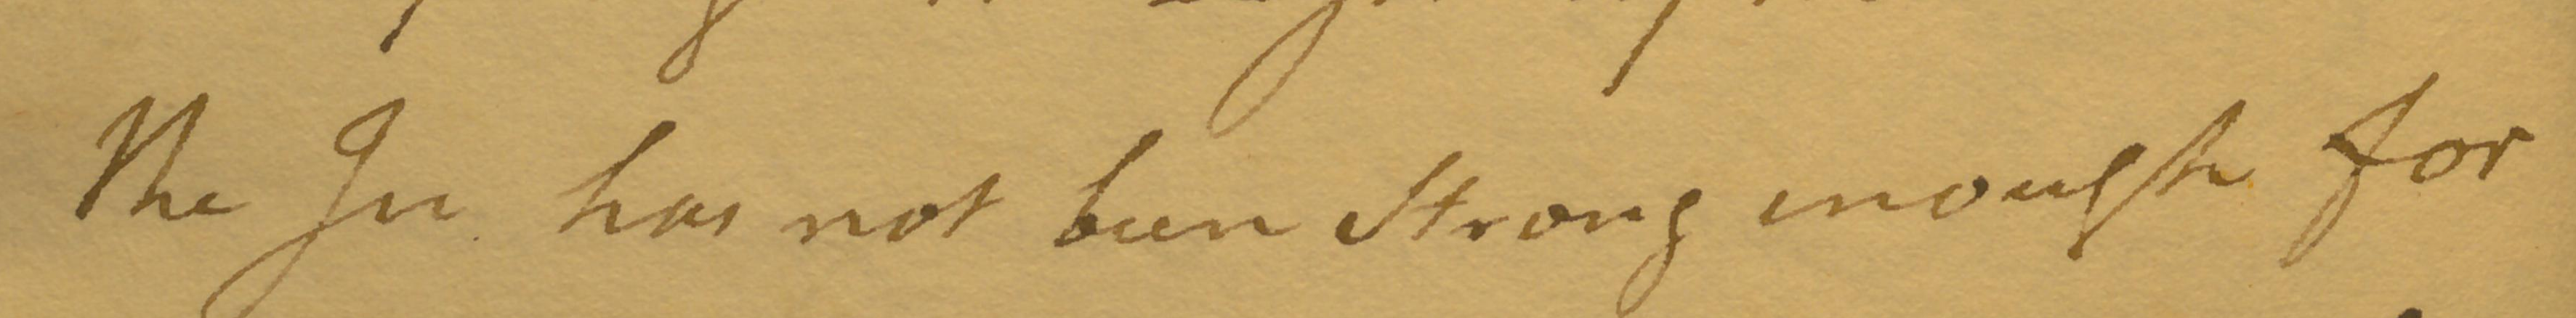the Ice has not been Strong enough for
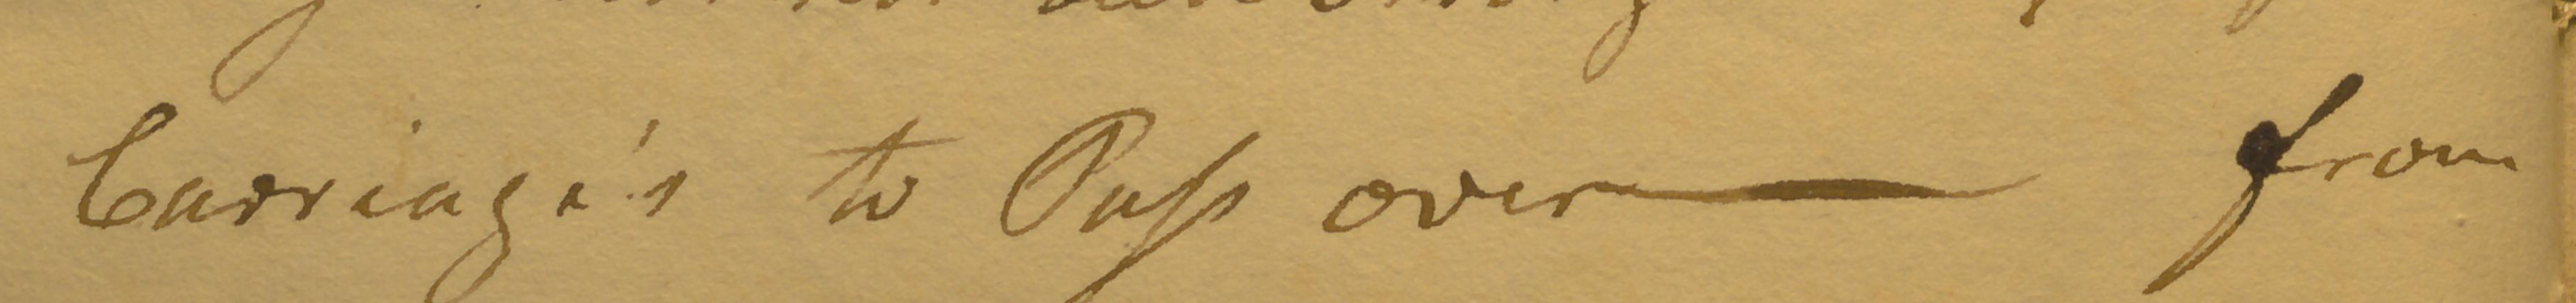Carriages to Pass over from
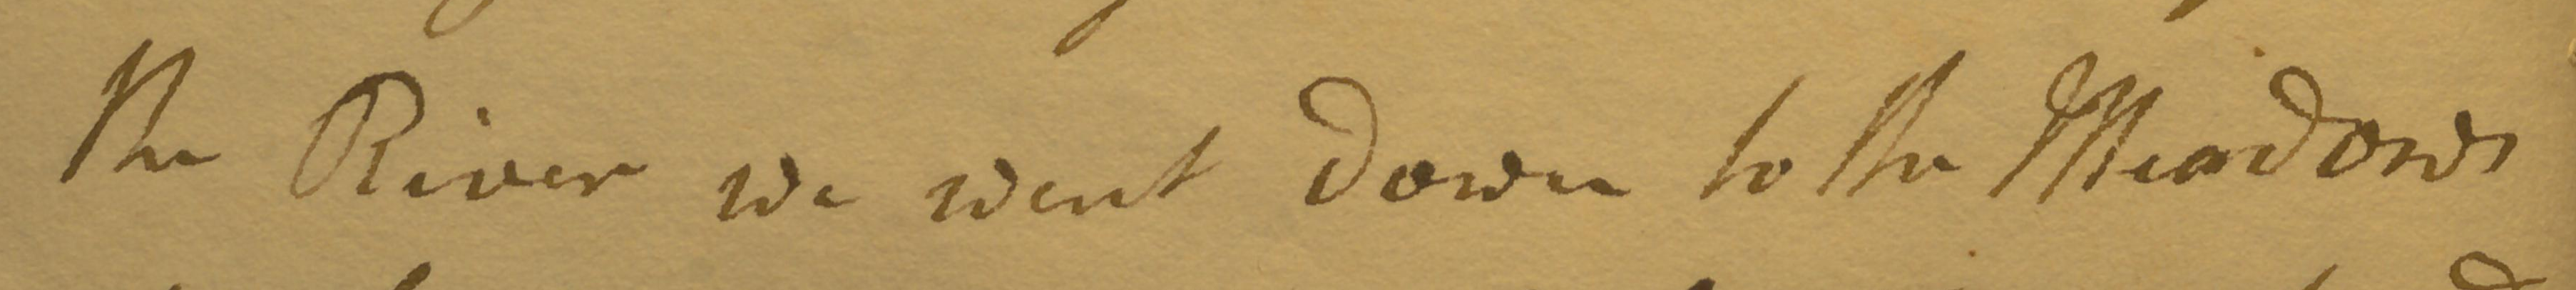the River we went down to the Meadows
